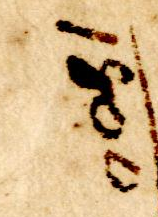1800
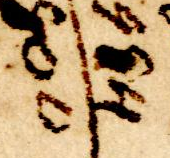984
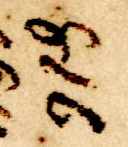816
